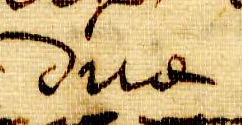due
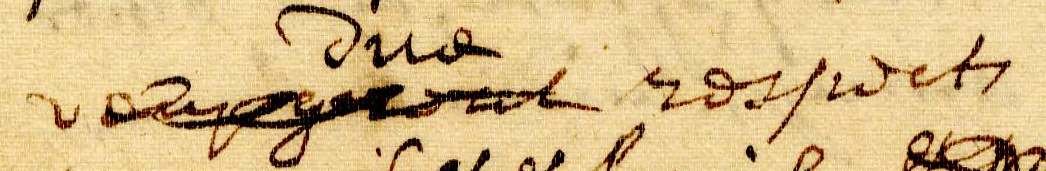[_______] respects
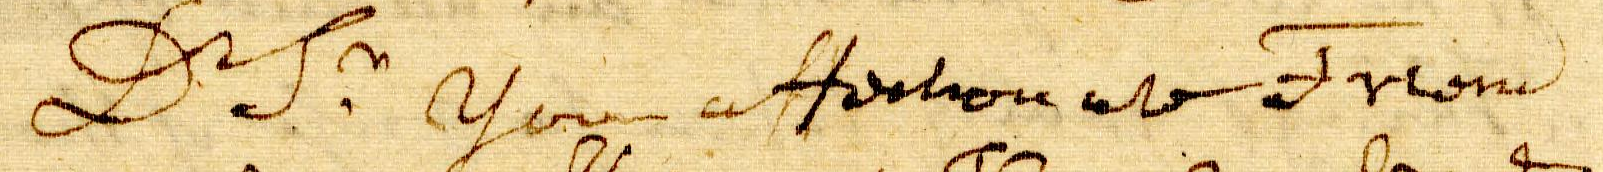D^r S^r. Your affectionate Friend
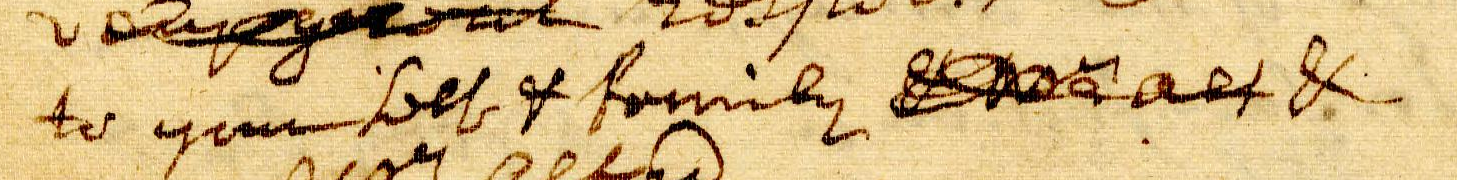to your self & family [____] &
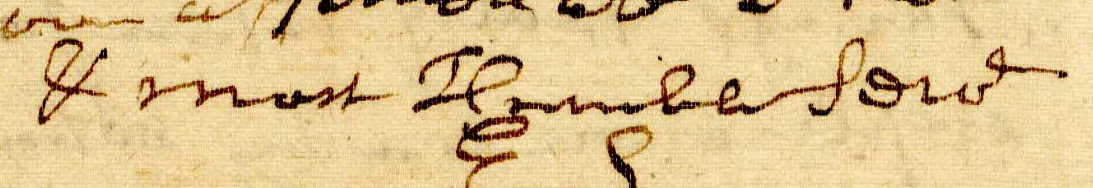& most Humble serv^t
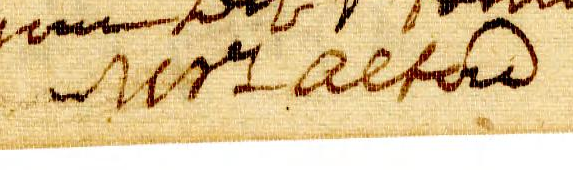Mr^s Alford
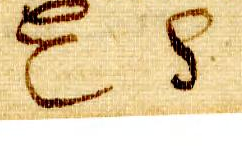ES
